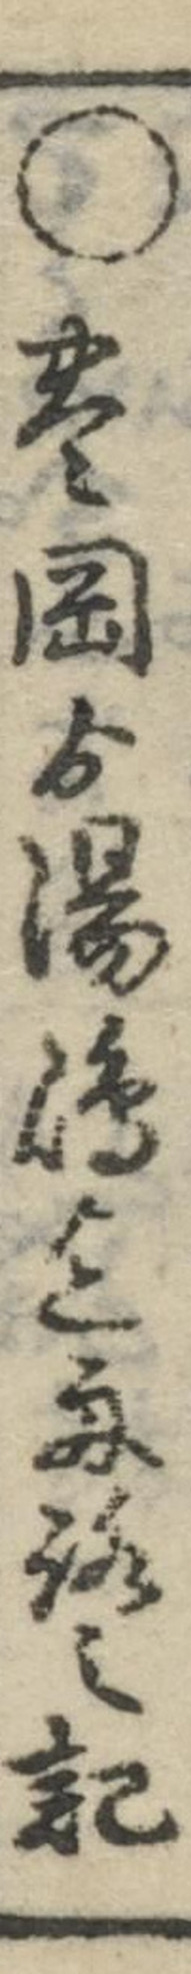○豊岡ゟ湯嶋迄舟路之記
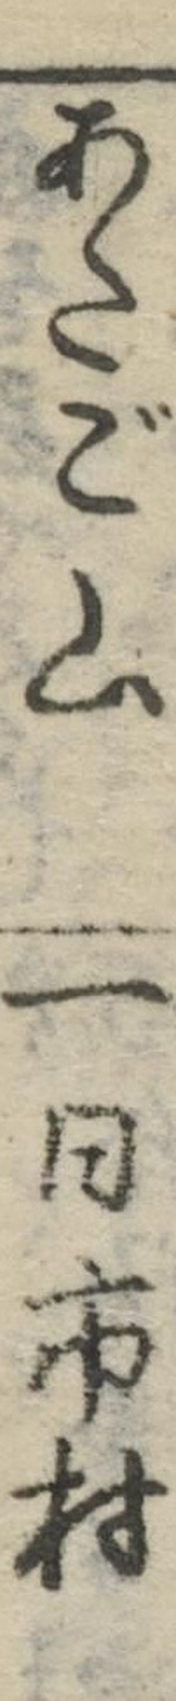あたご山一日市村
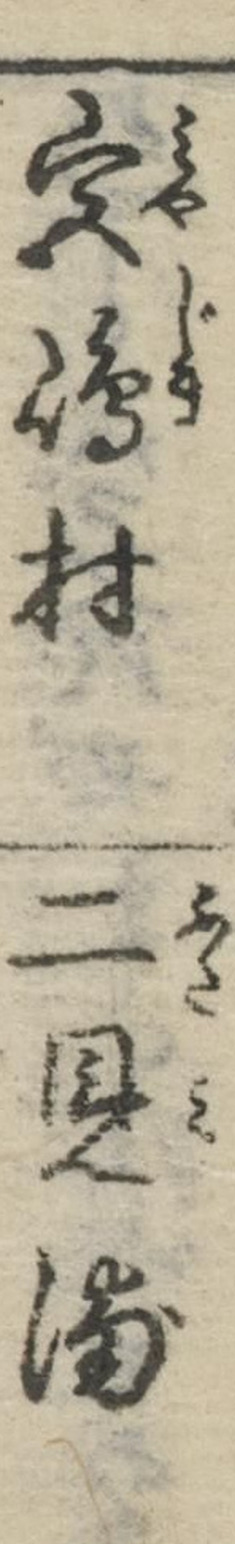宮嶋村二見浦
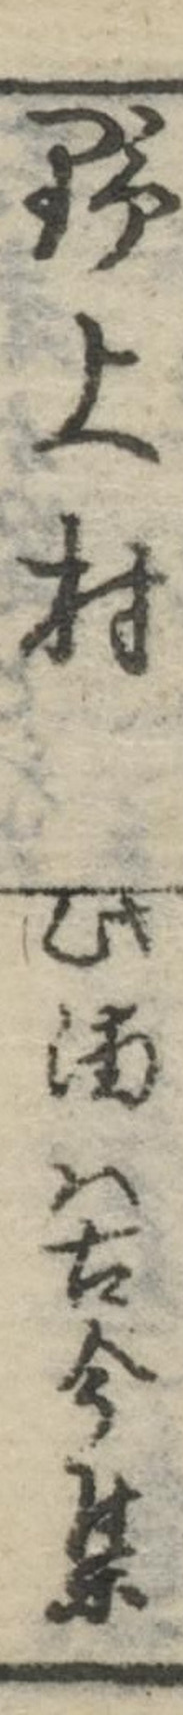野上村此浦は古今集
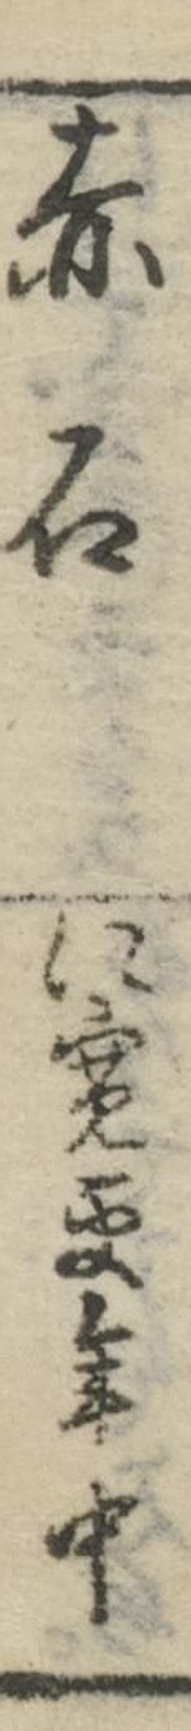赤石に寛平年中
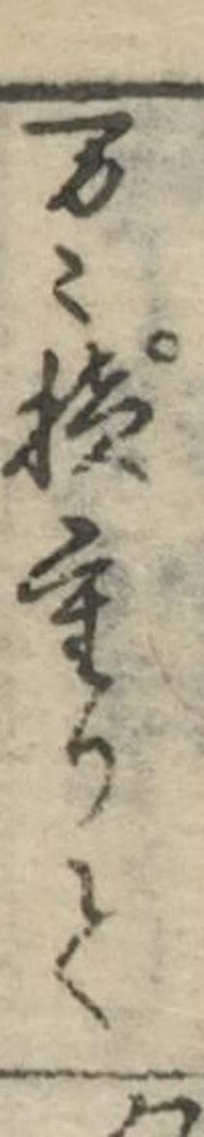万〻。横重りて

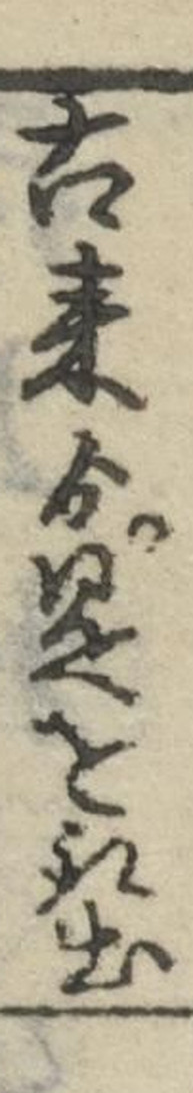古来ゟ。是を取出
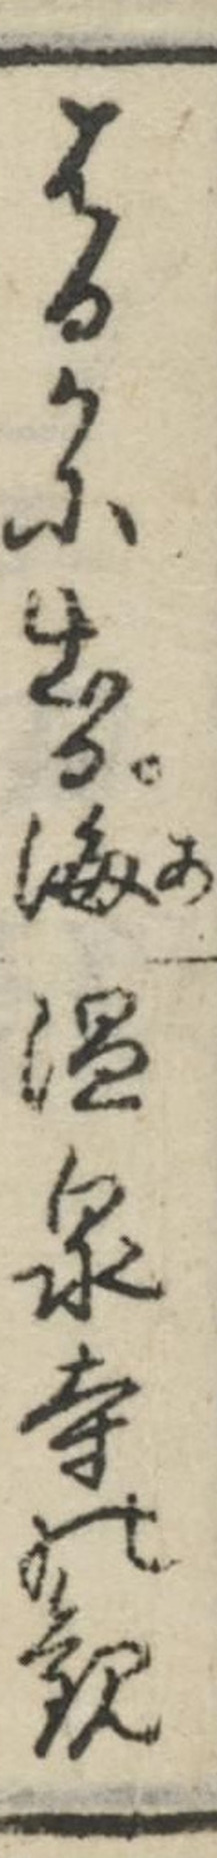はるかに出る。海温泉寺の観
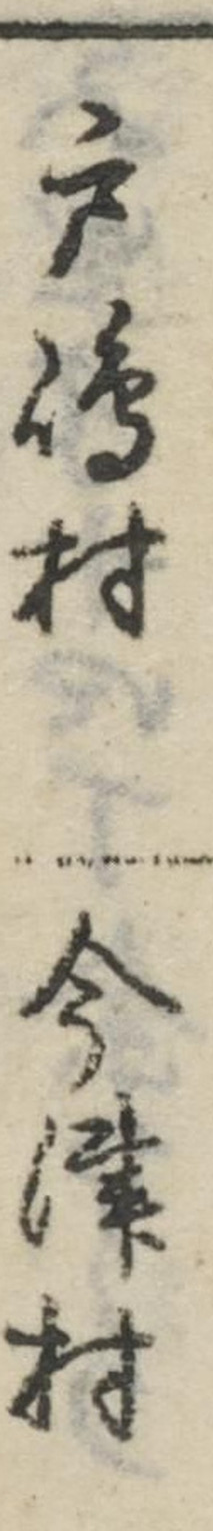戸嶋村今津村
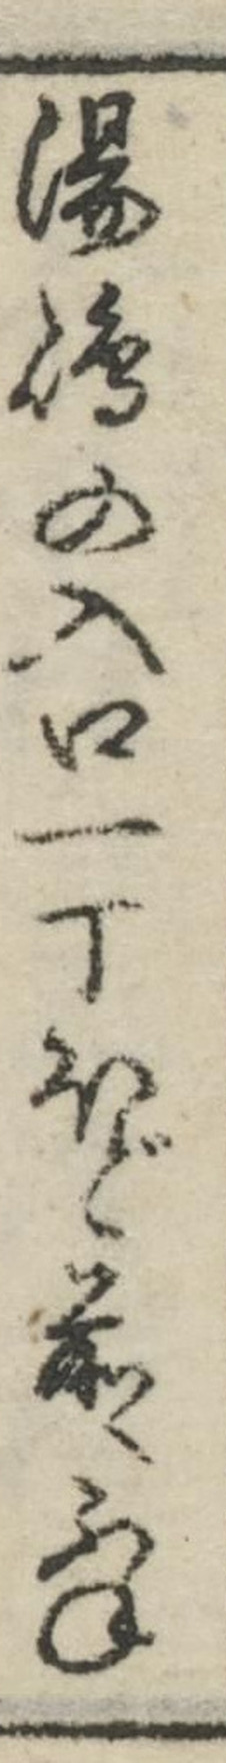湯嶋の入口一丁ほど前へふね
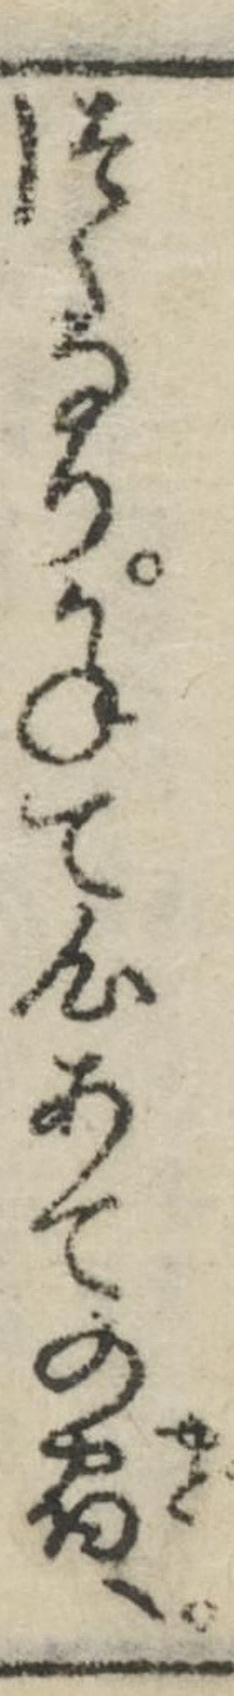つくなり。かねて心あての宿へ
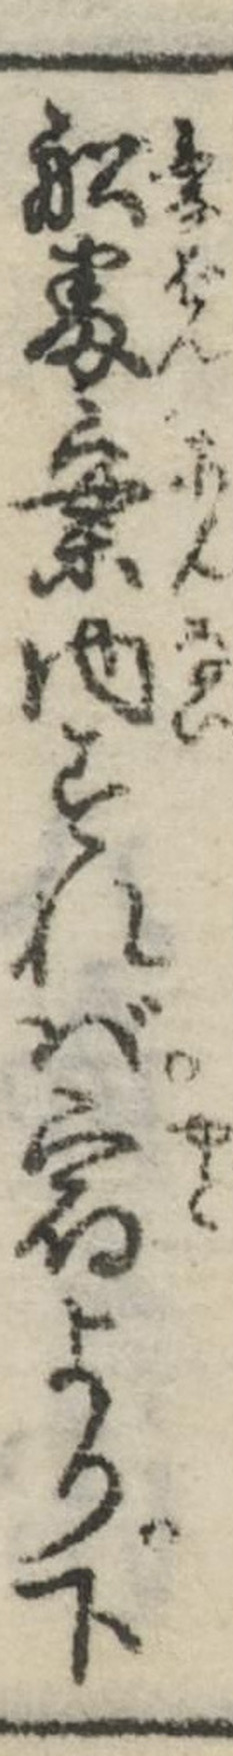舩番案内すれば。宿より。下
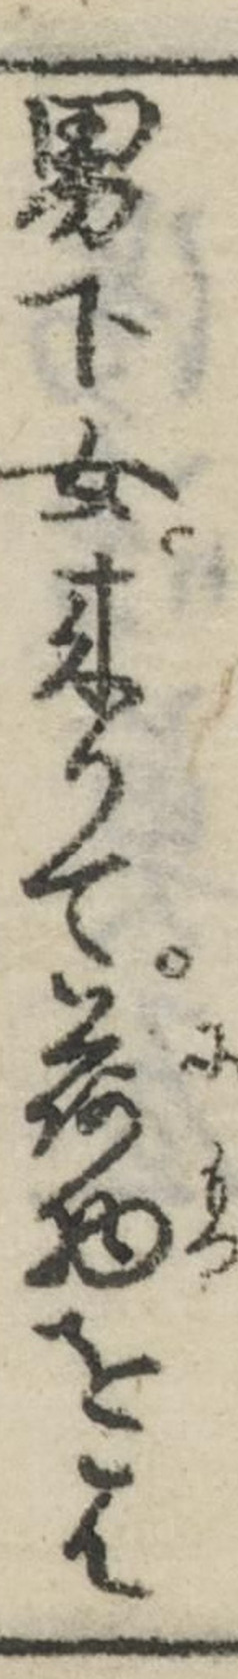男下女。来たりて。荷物をは
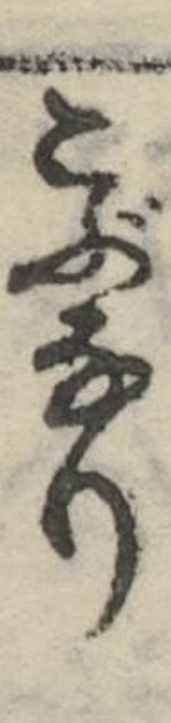こぶなり

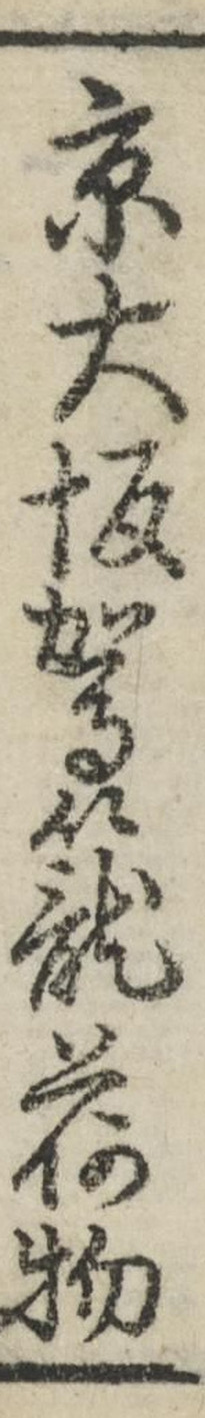京大坂駕籠荷物
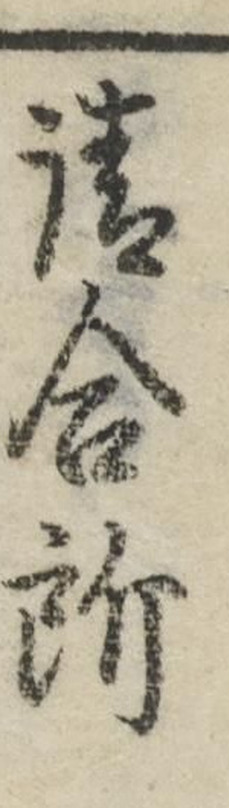請合所
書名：但州城崎浴湯辧
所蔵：東京大学地震研究所図書室 Earthquake Research Institute Library, The University of Tokyo, JAPAN
